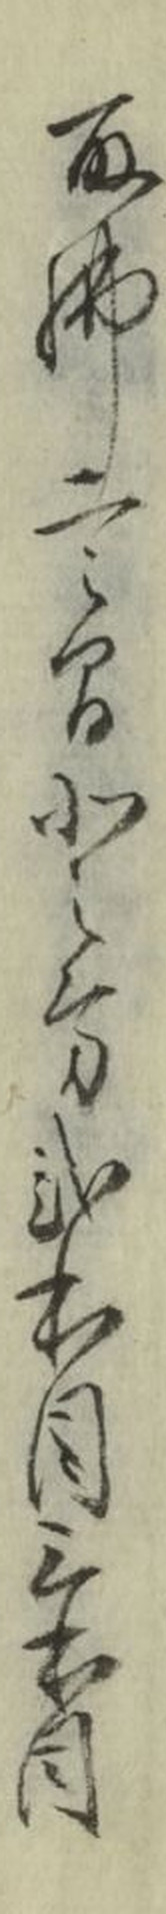取払二之間北之方弐本目三本目
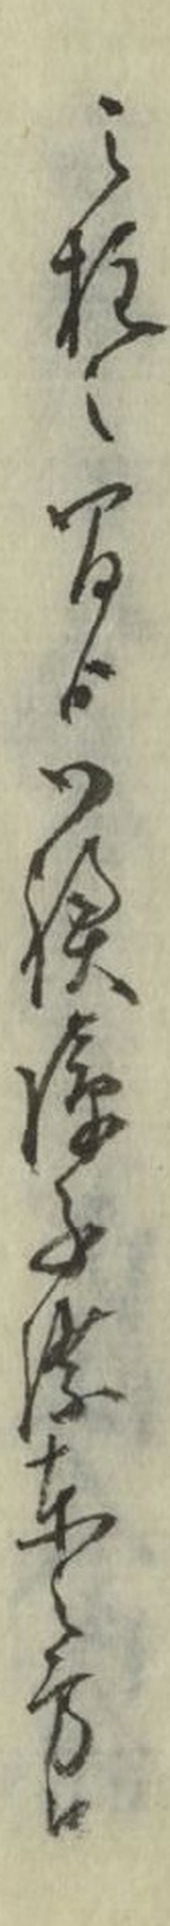之柱之間ゟ御襖障子際東之方え
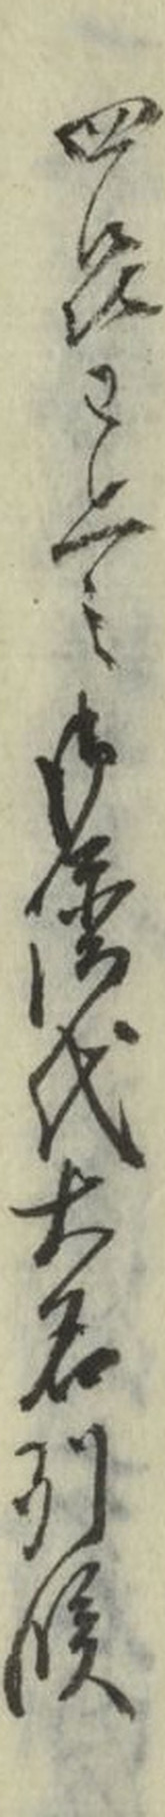四品已上之御譜代大名列候

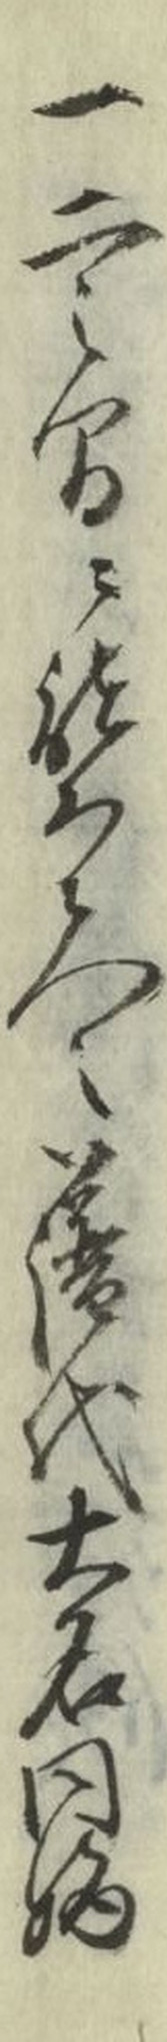一二之間に諸大夫之御譜代大名同嫡
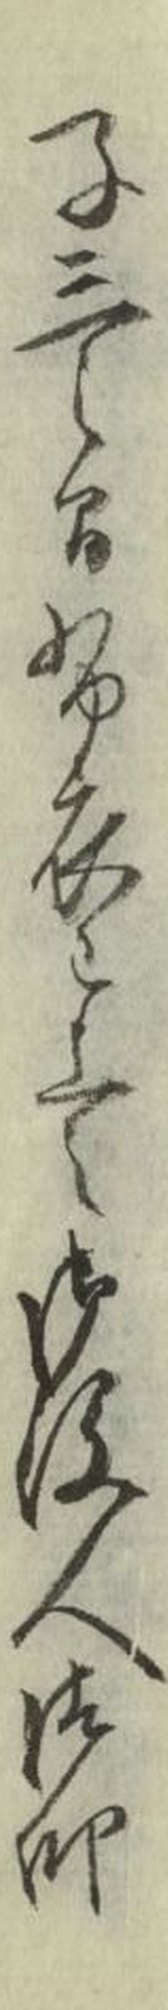子三之間布衣已上之御役人法印
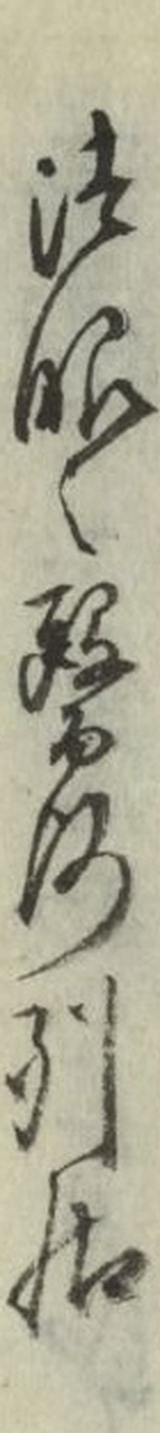法眼之医師列居
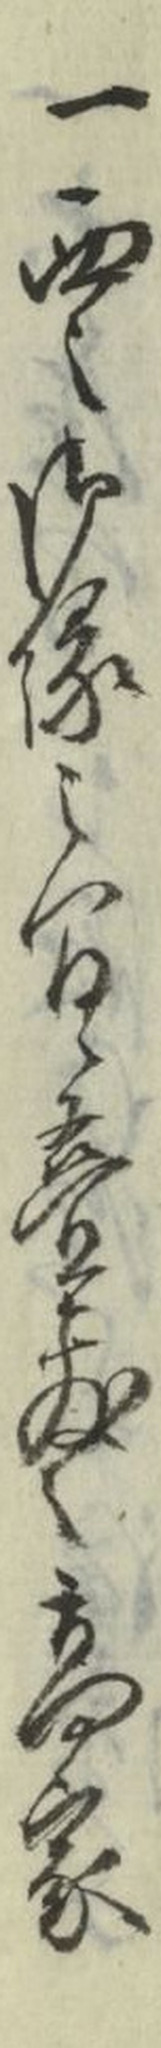一西之御縁之間に畳敷之高家
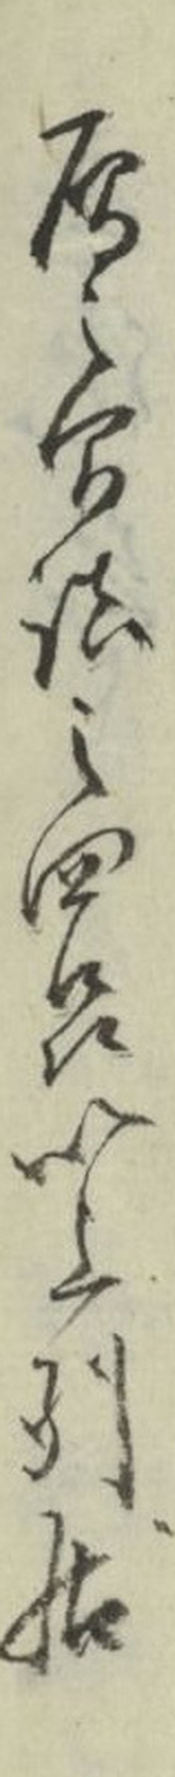雁之間詰之四品以上列居
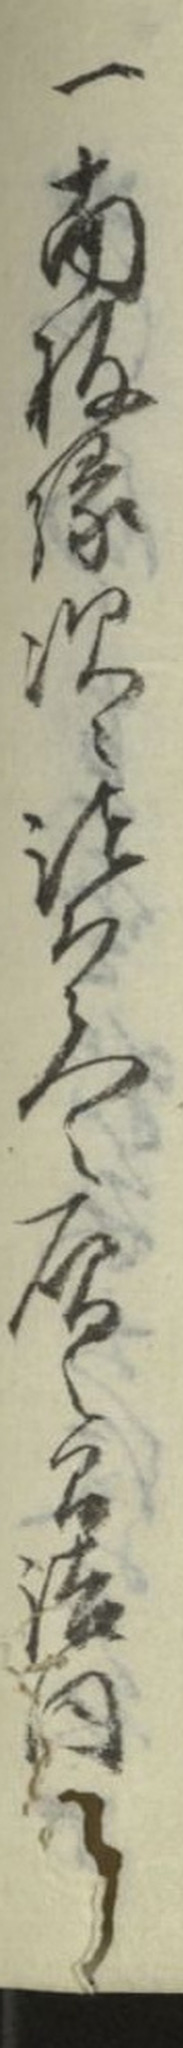一南板縁次に諸大夫之雁之間詰同
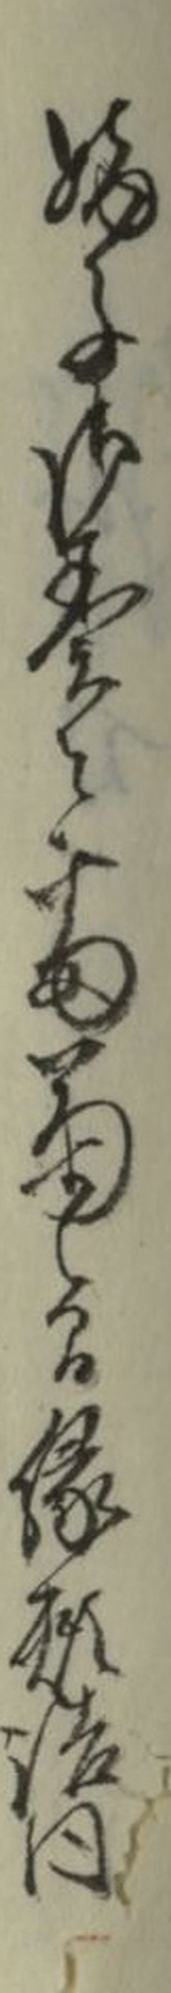嫡子御奏者番菊之間縁頬詰同
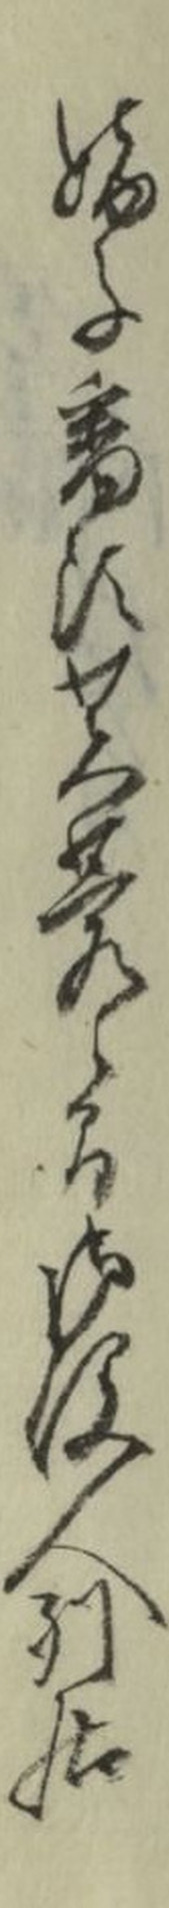嫡子番頭芙蓉之間御役人列居
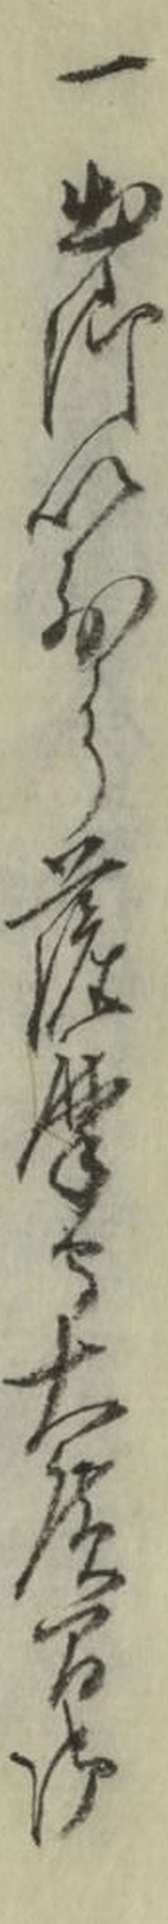一出御以前より薩摩守大広間御
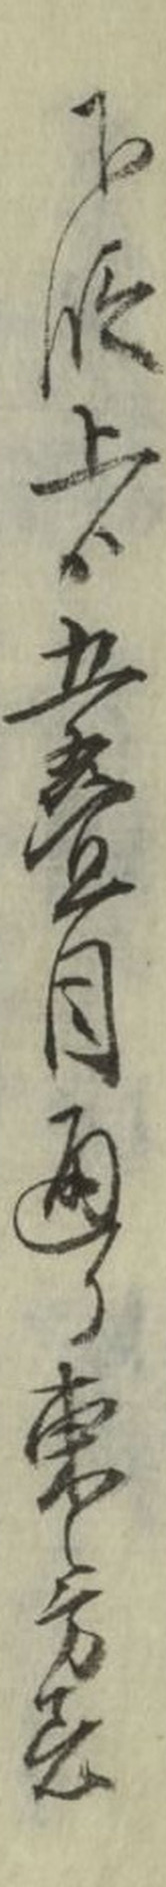下段上ゟ五畳目通り東之方着
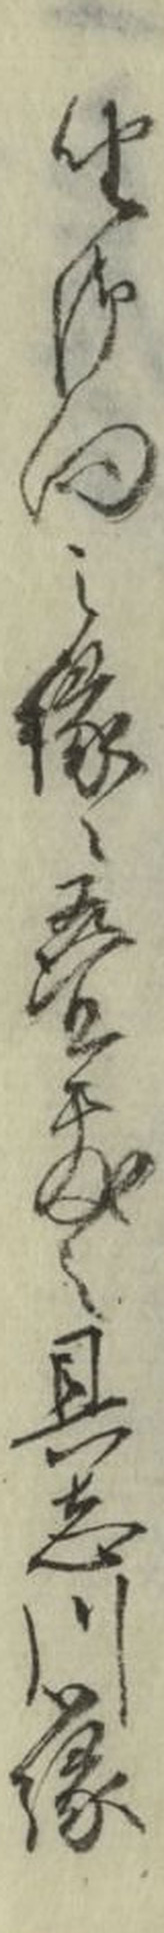坐御向之縁に畳敷之具志川御縁
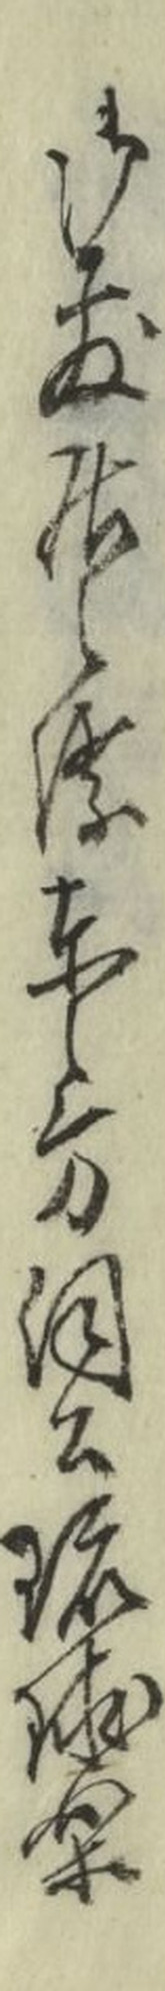御敷居之際東之方伺公琉球楽

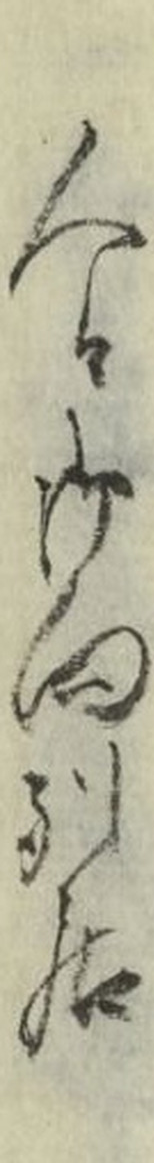人え御向列居
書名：琉球人来朝記 四之五
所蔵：University of the Ryukyus Library
